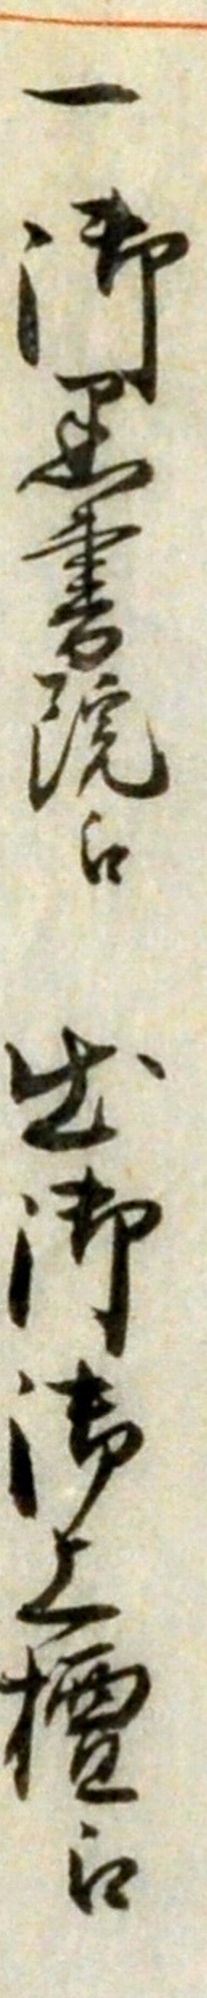一御黒書院え出御御上壇え
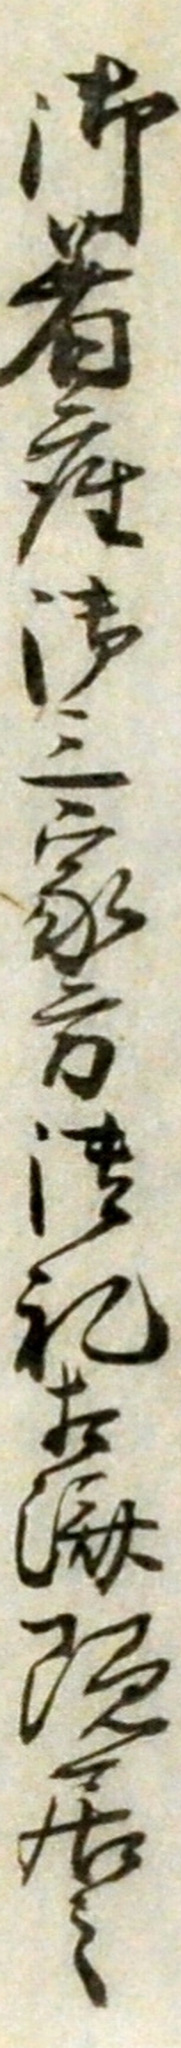御着座御三家方御礼相済隠居之
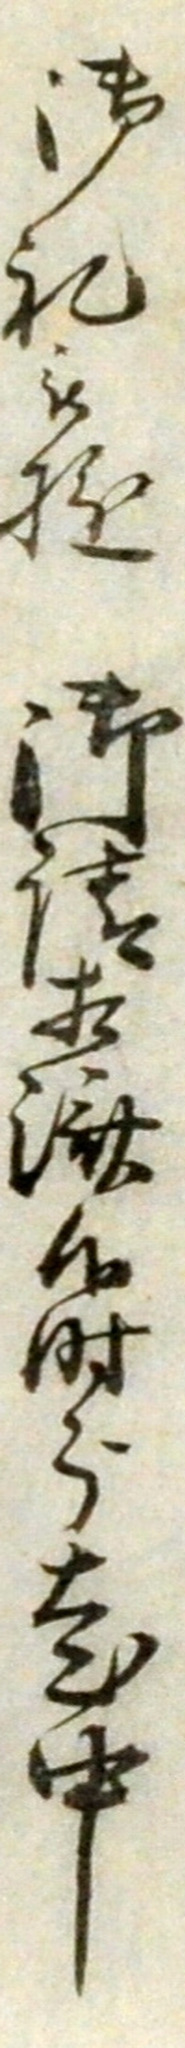御礼被遊御請相済候時分老中
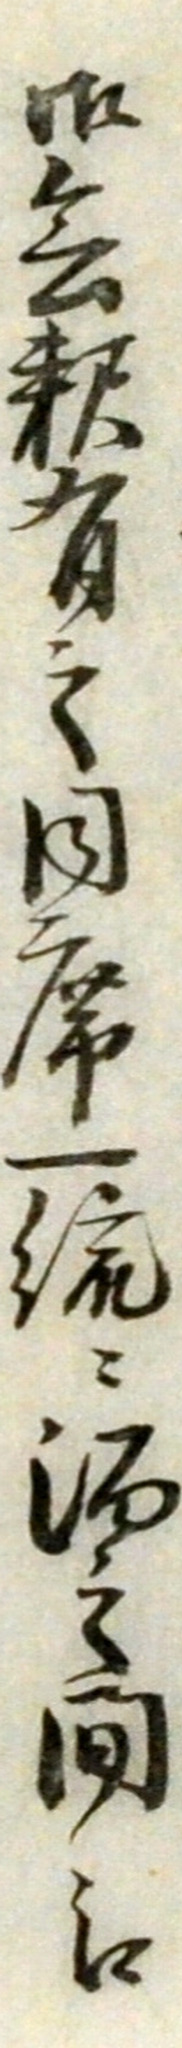御会釈有之同席一統に溜之間え
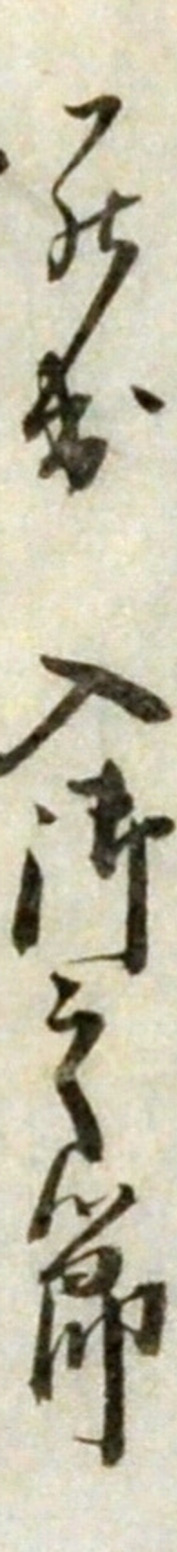罷出入御之節
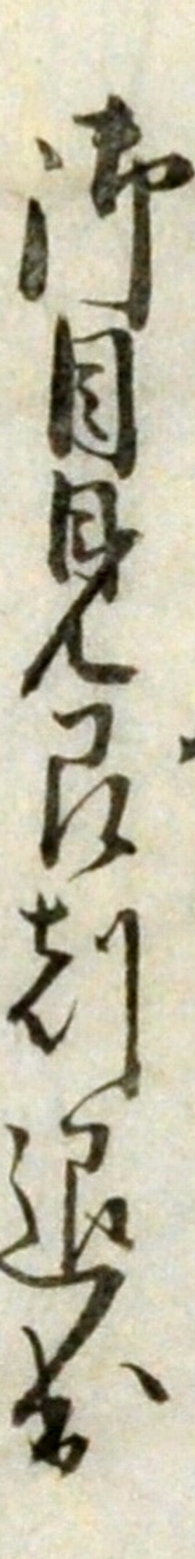御目見即刻退出
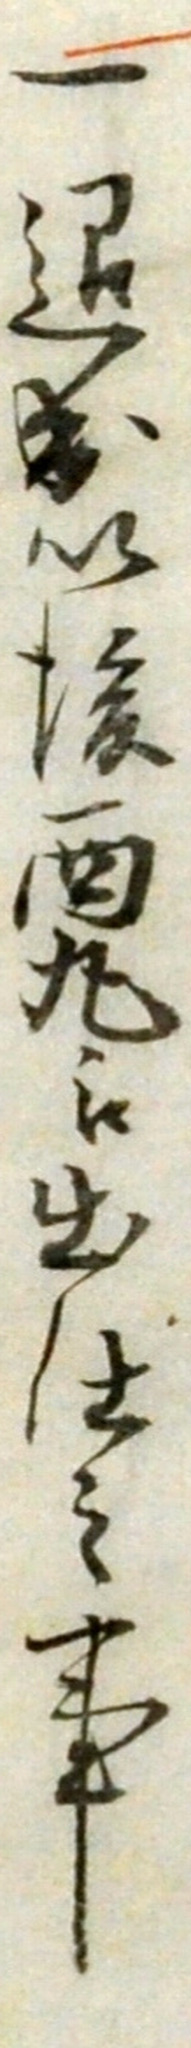一退出以後西丸え出仕之事

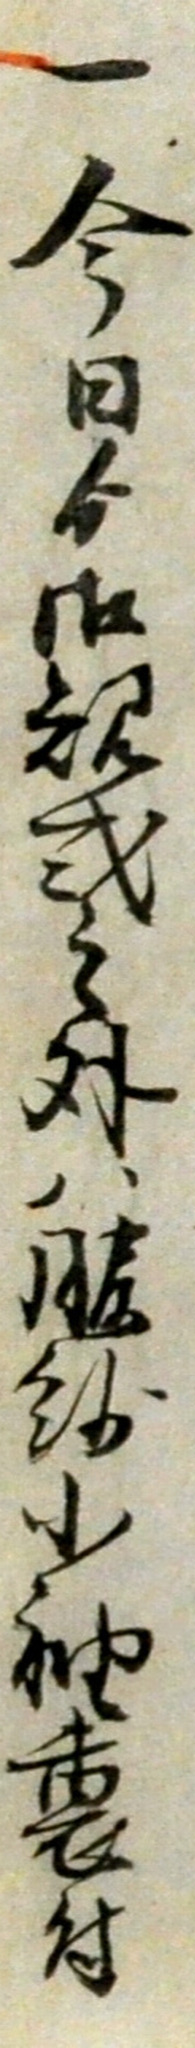一今日ゟ御規式之外は服紗小袖裏付
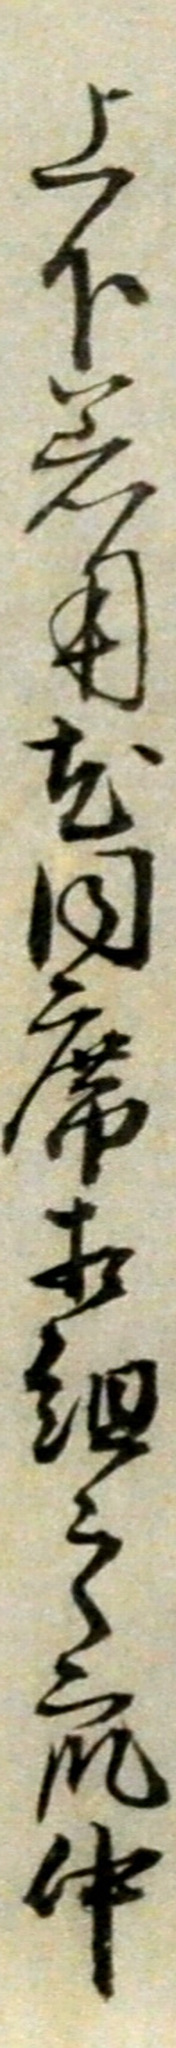上下着用尤同席相組之衆中
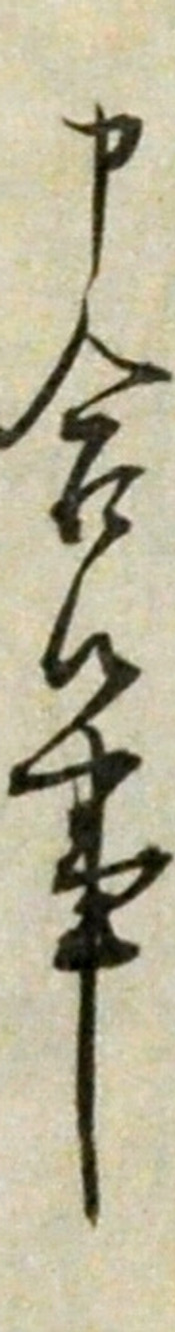申合候事
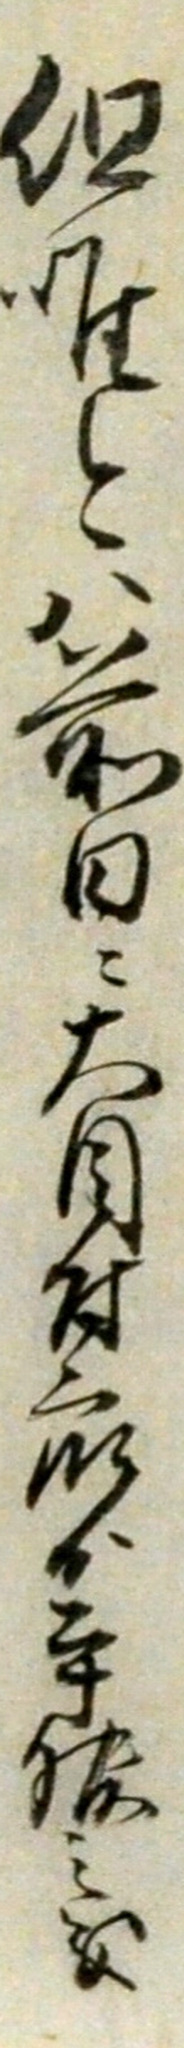但唯今は前日に大目付衆ゟ平服之義
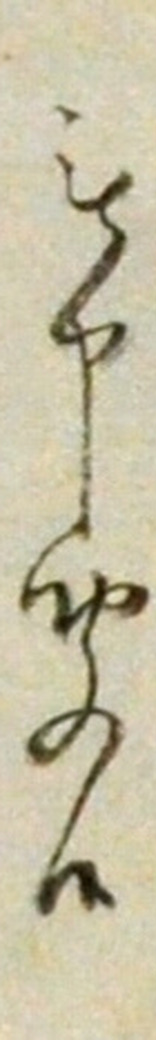被申聞候
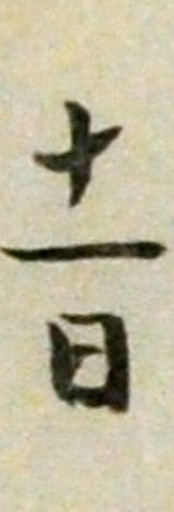十一日
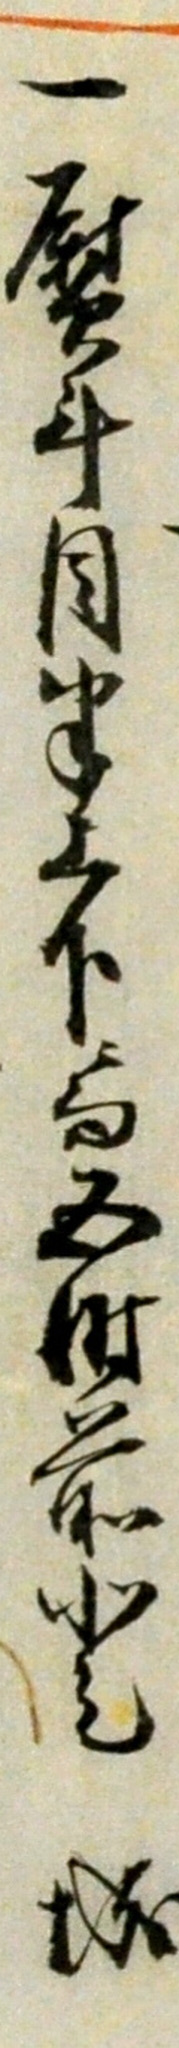一熨斗目半上下にて五時前登城
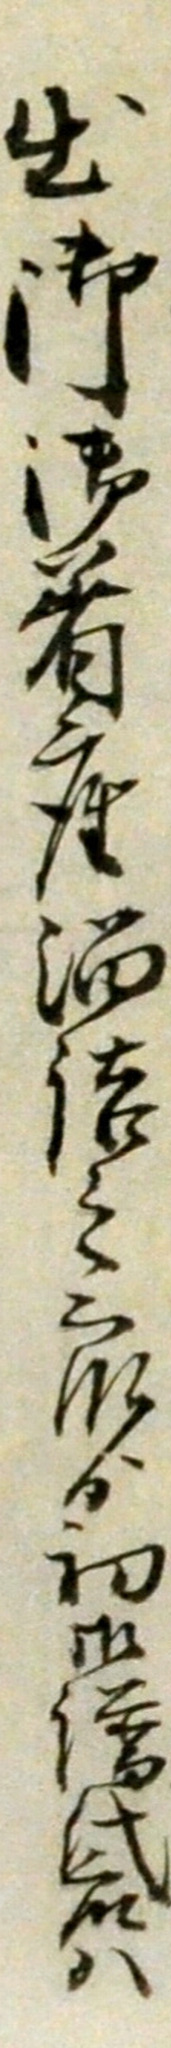出御御着座溜詰之衆ゟ初御譜代衆は
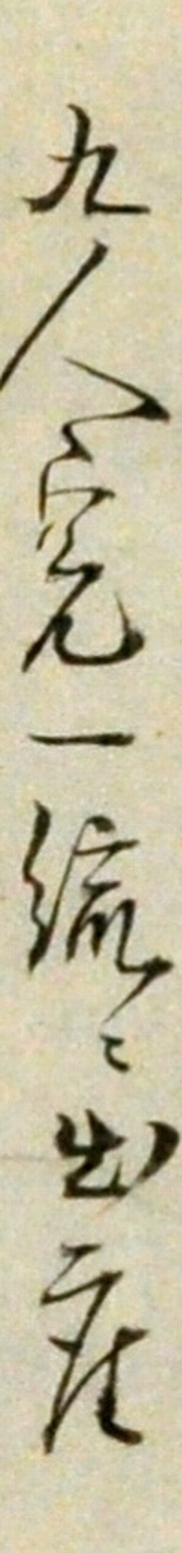九人宛一統に出座
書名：申合帳〔一括〕
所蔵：伊那市立高遠町図書館・合同会社AMANE
